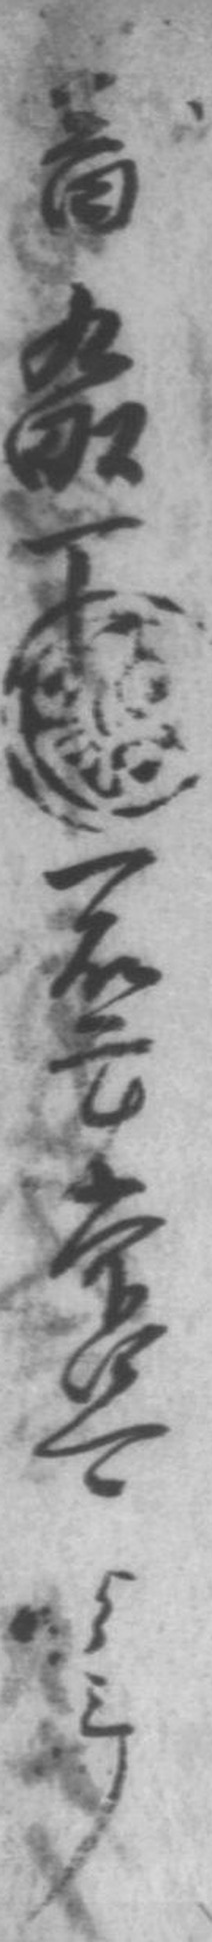荒田九畝一分㊞一石二斗六升四合与三郎
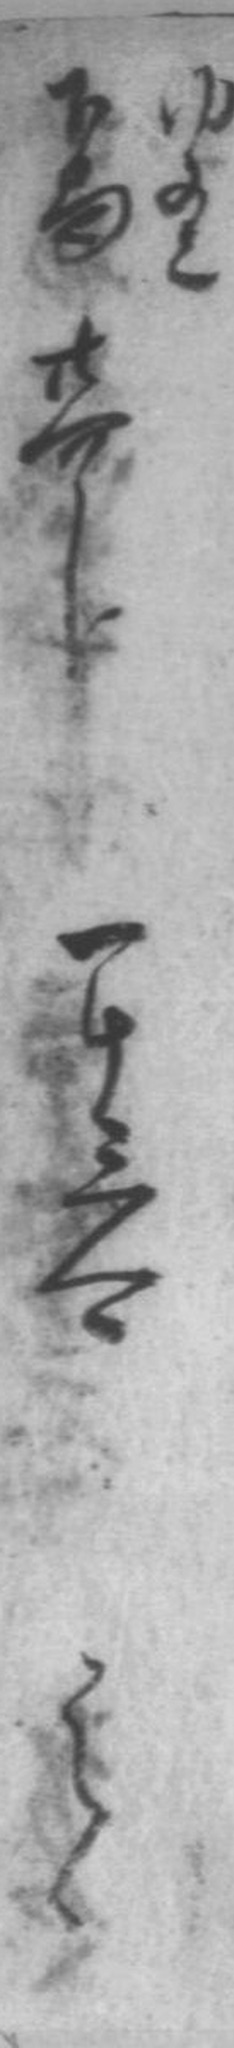下畠廿四分一斗三合同人
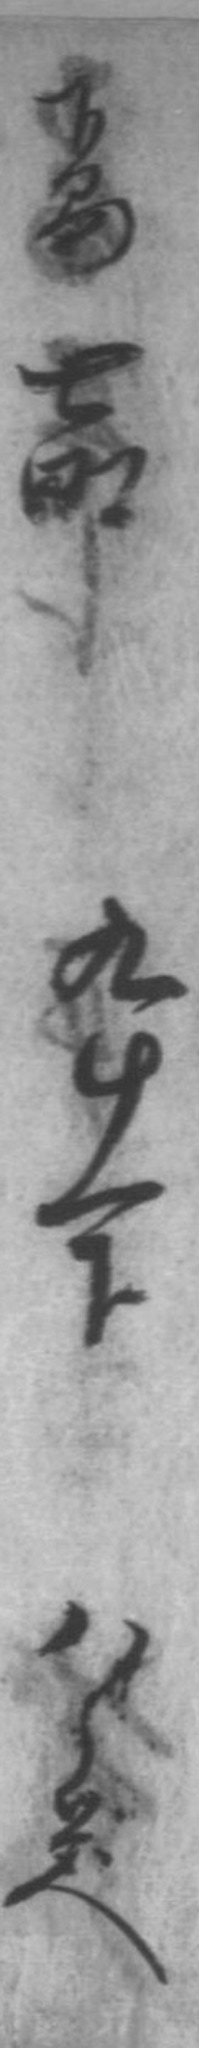下畠七畝九斗一升八郎兵衛
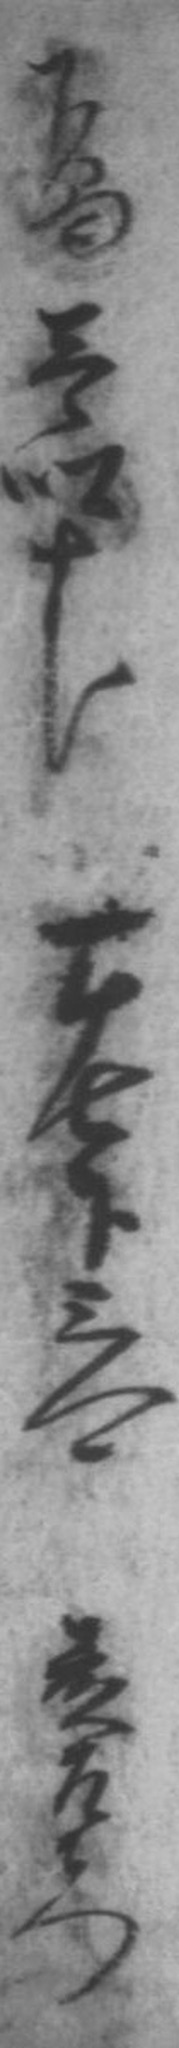下畠壱畝十分一斗七升三合彦左衛門

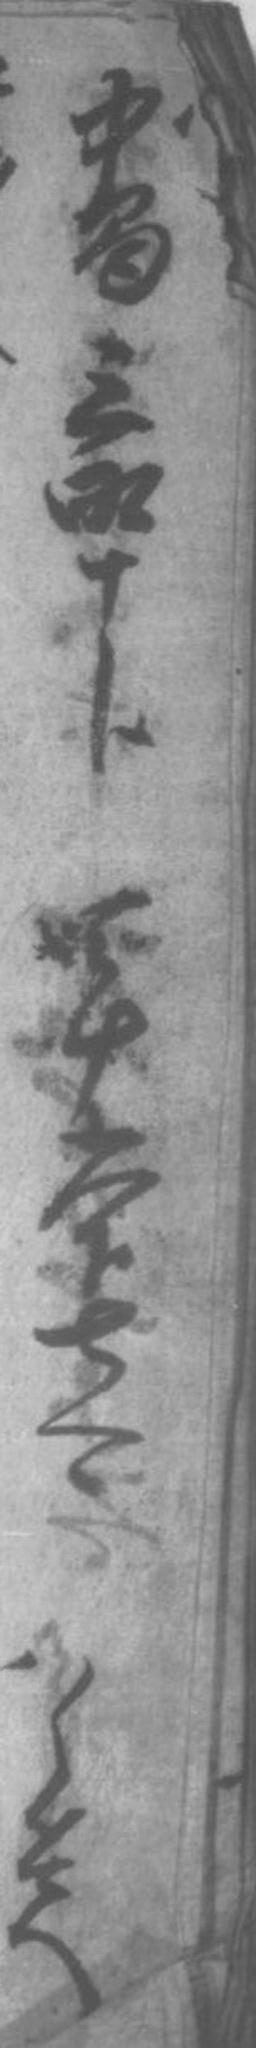中畠三畝十分四斗六升七合八郎兵衛
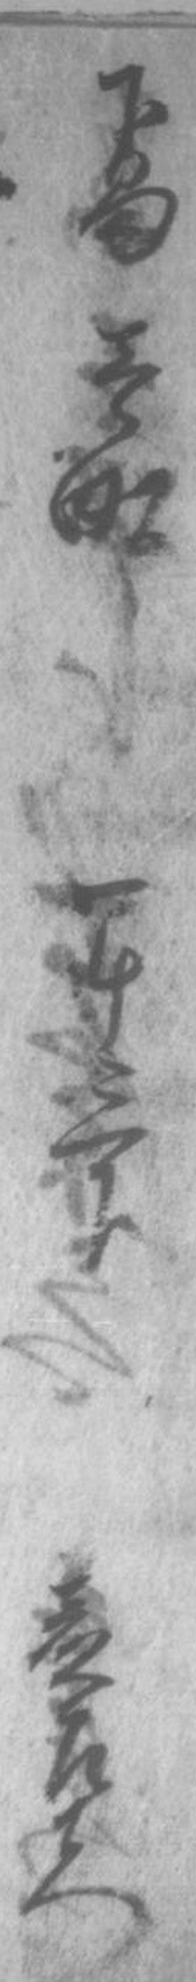下畠壱畝一斗三升彦左衛門
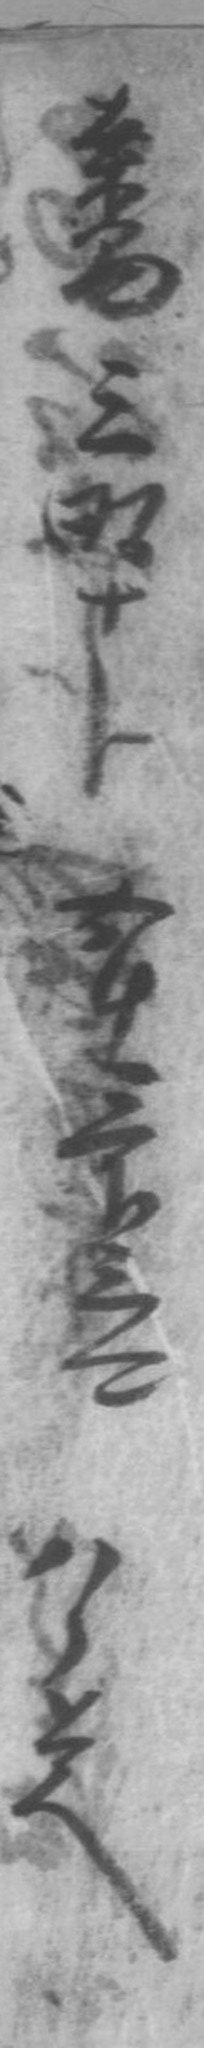桑畠三畝十分五斗三升三合八郎兵衛
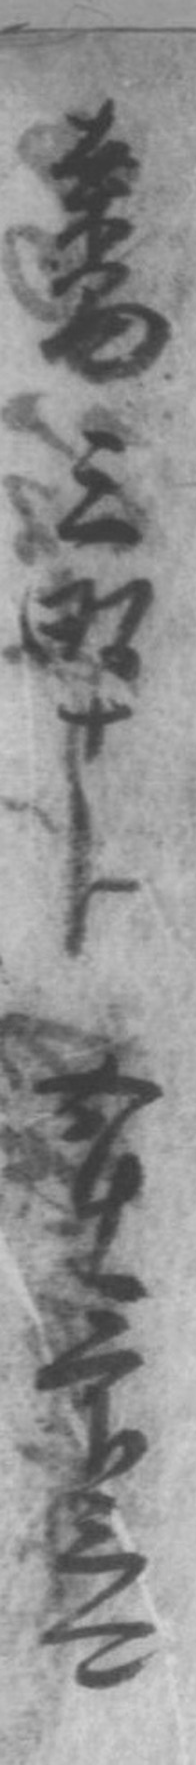桑畠三畝十分五斗三升三合八郎兵衛
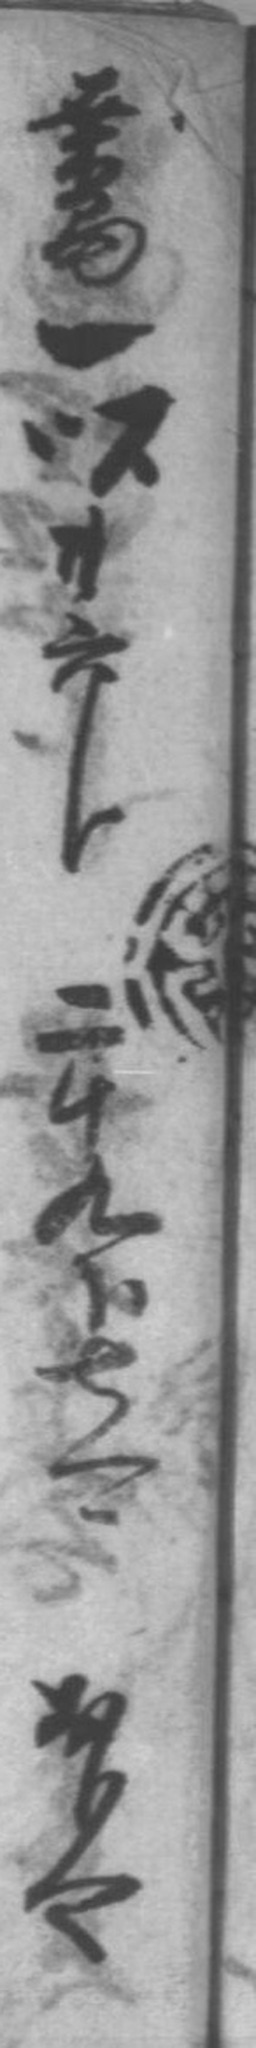桑畠一畝廿六分二斗九升七合おりや
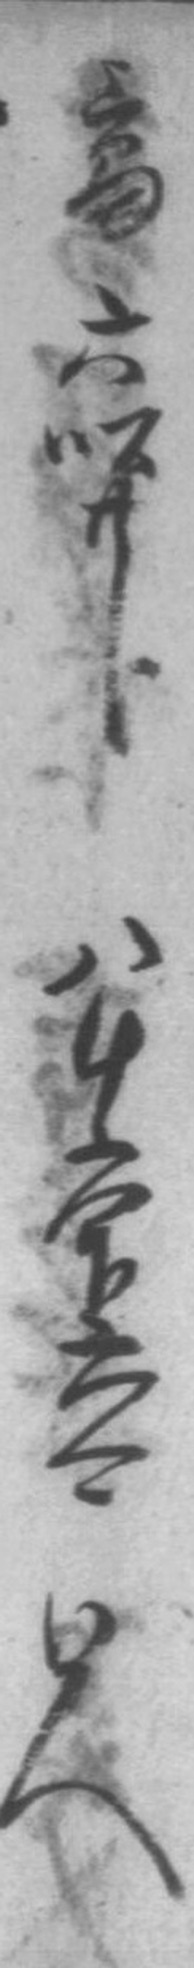上畠六畝廿分八斗六升六合同人
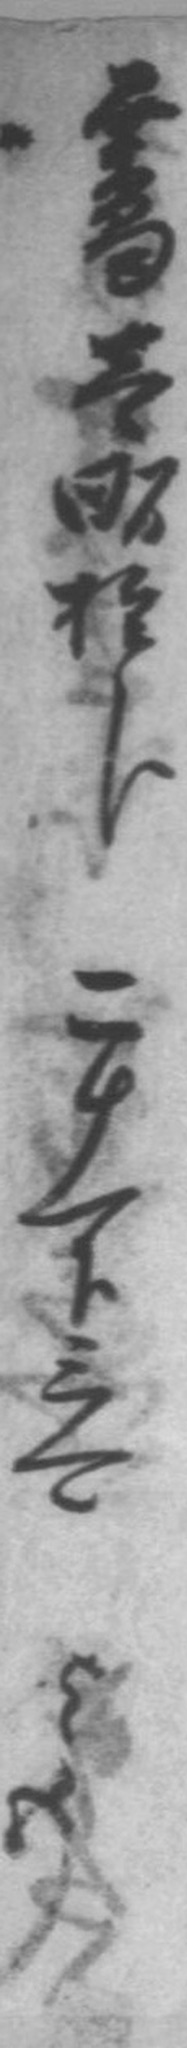桑畠壱畝拾分二斗一升三合与五郎
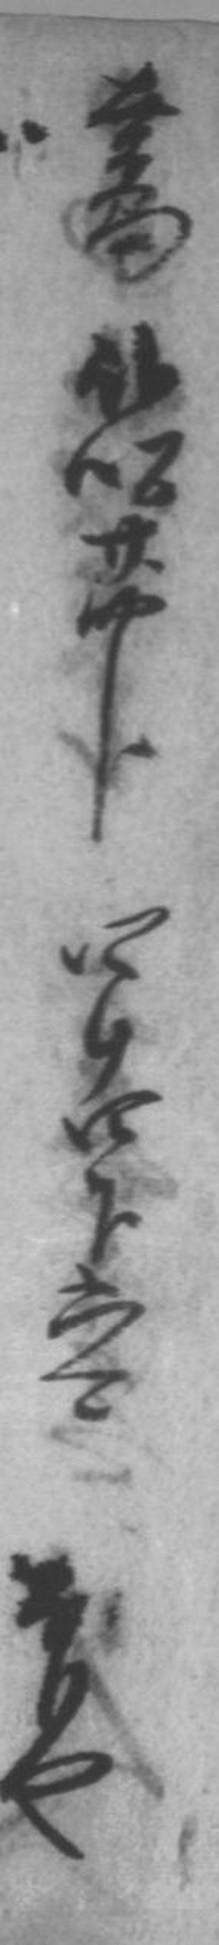桑畠弐畝廿四分四斗四升六合おりや
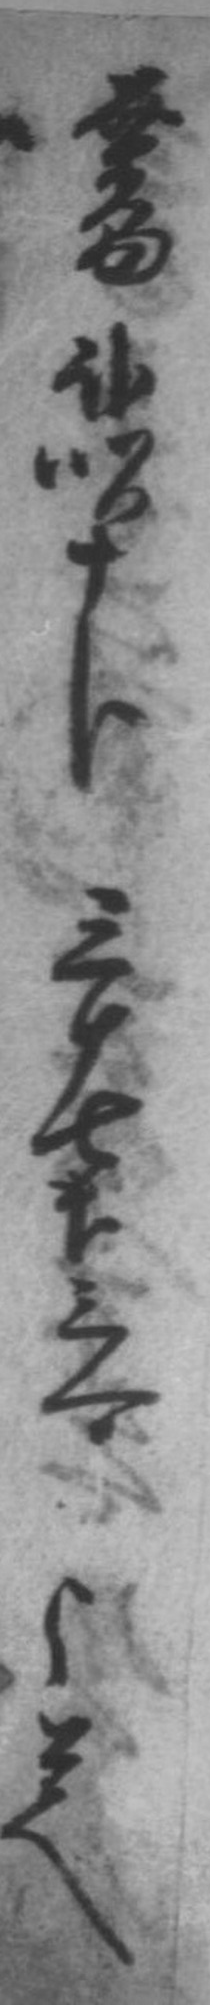桑畠弐畝十分三斗七升三合与三郎

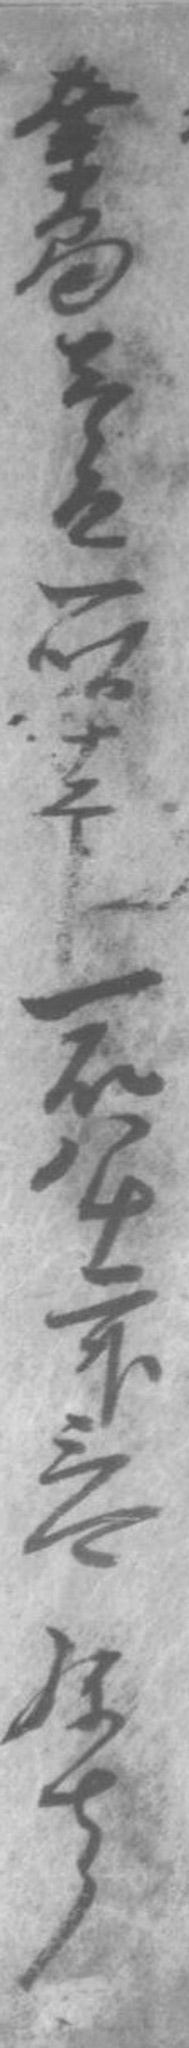桑畠壱反一畝十二分一石八斗二升三合弥七郎
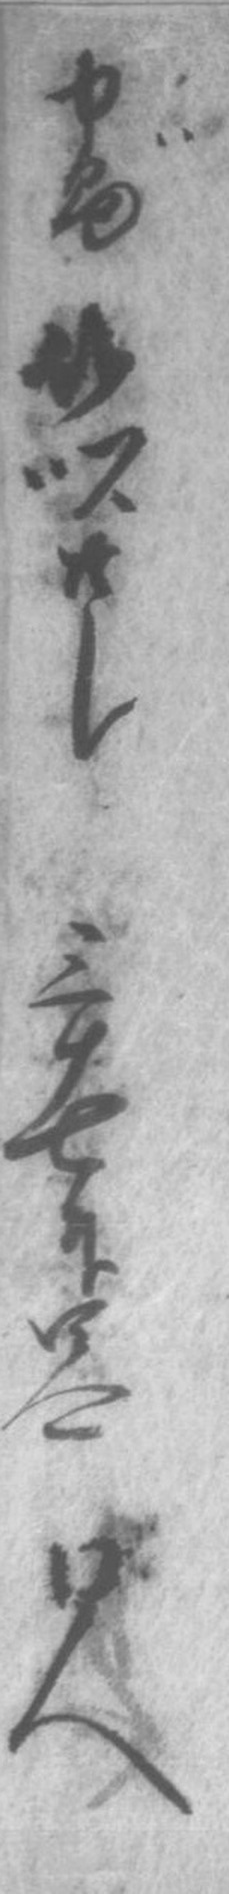中畠弐畝廿分三斗七升四合同人
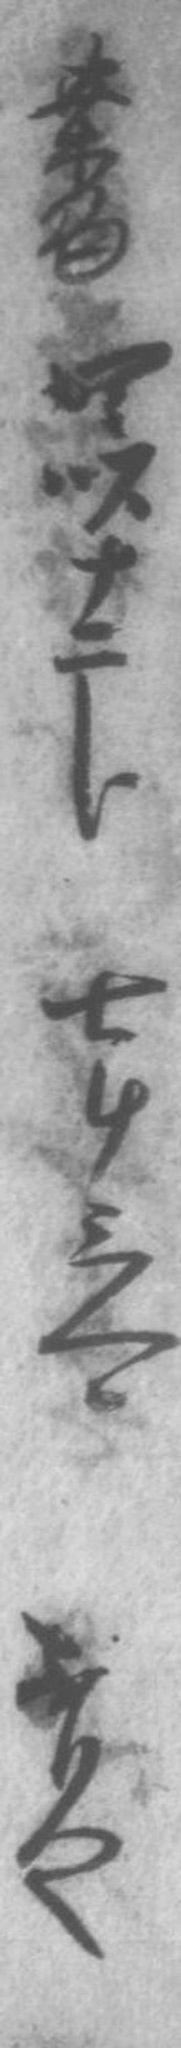桑畠四畝十二分七斗三合おりや
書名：越州大野郡ノ内不動堂村御検地帳
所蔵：福井県文書館 Fukui Prefectural Archives
